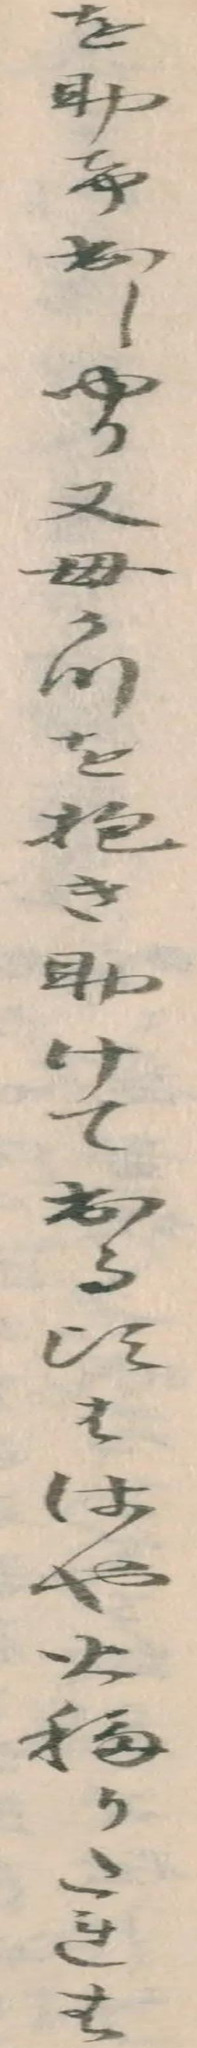を助け出しやり又母かつを抱き助けて出る頃ははや火移りたれは
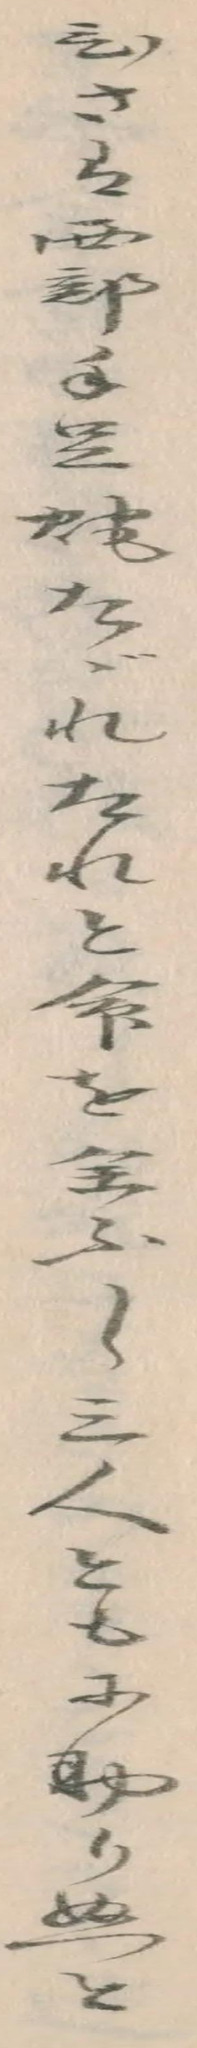ひさは西部手足焼たゞれたれと命を全ふし三人ともに助りぬと
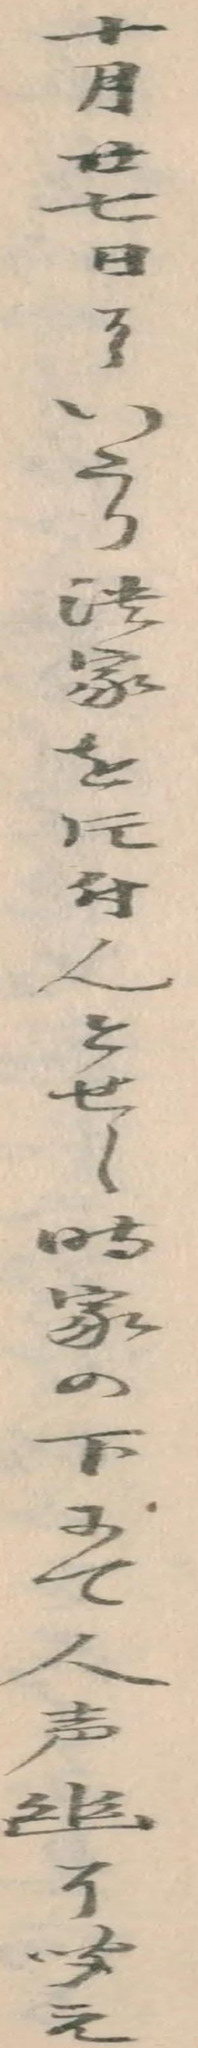十月廿七日にいたり潰家を片付んとせし時家の下にて人声幽に聞え

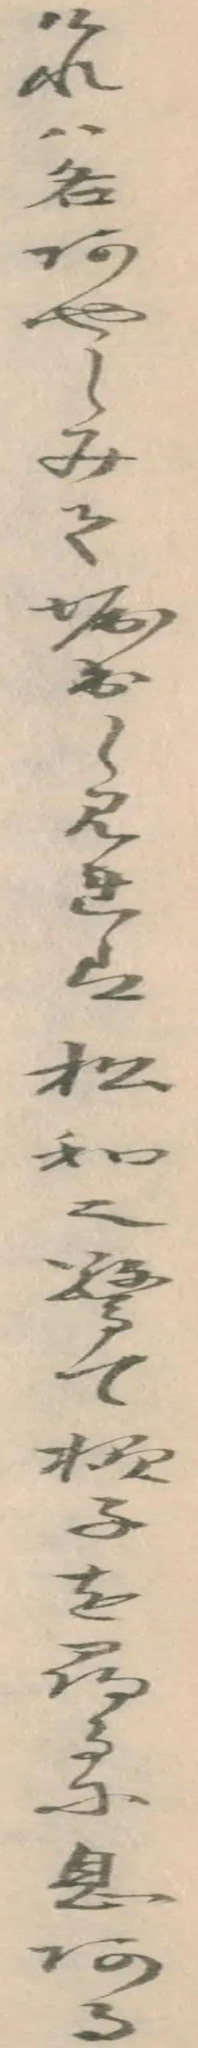けれは各あやしみて堀出し見れは松和也驚て様子を尋るに息ある
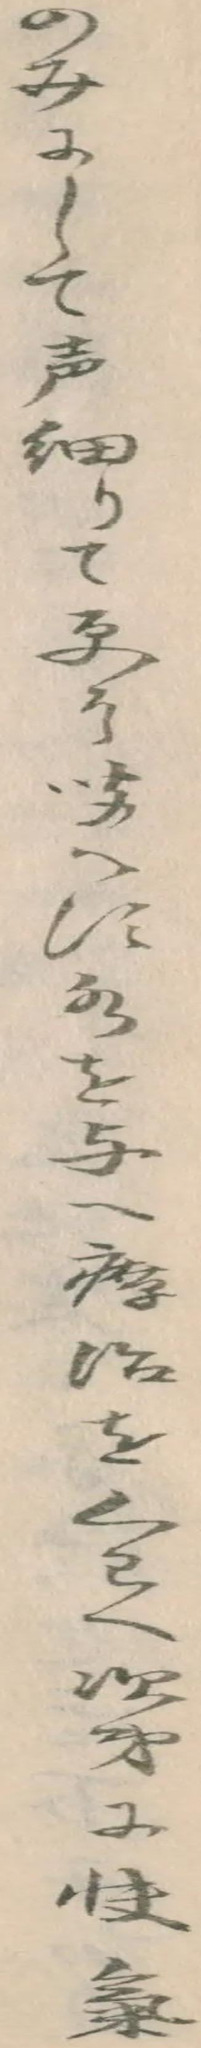のみにして声細りて更に聞へす水を与へ療治をくわへ次第に快気
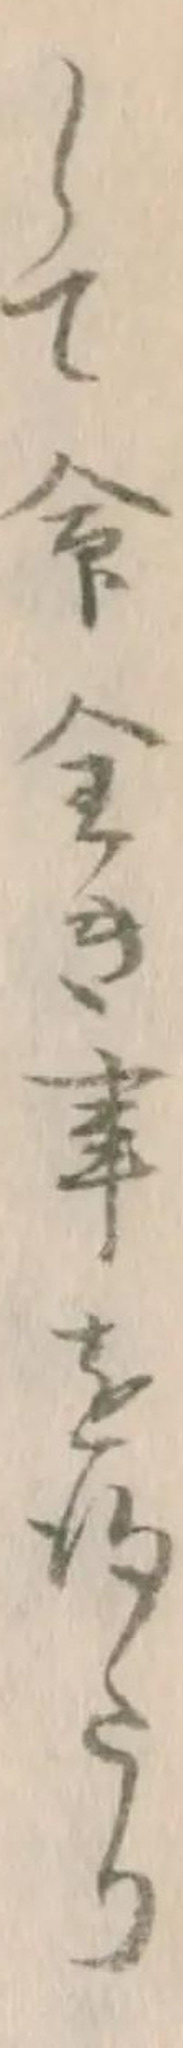して命全き事を得たり
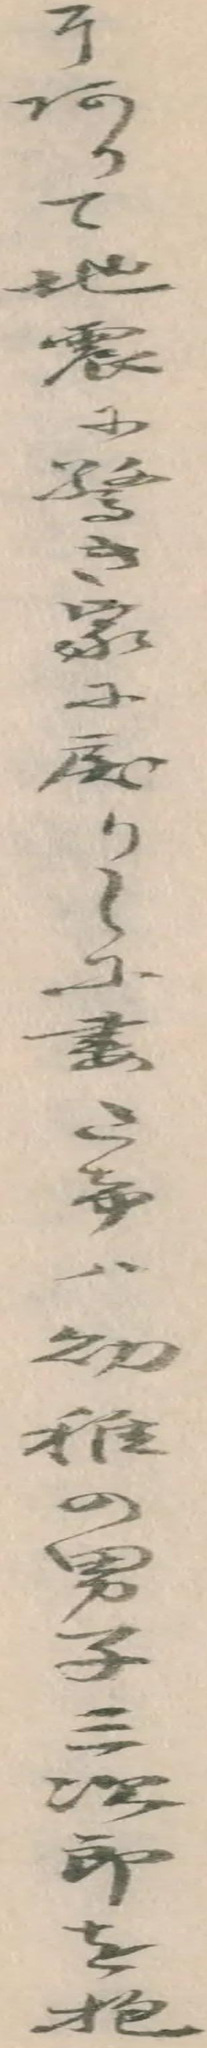にありて地震に驚き家に戻りしに妻たけは幼稚の男子三次郎を抱
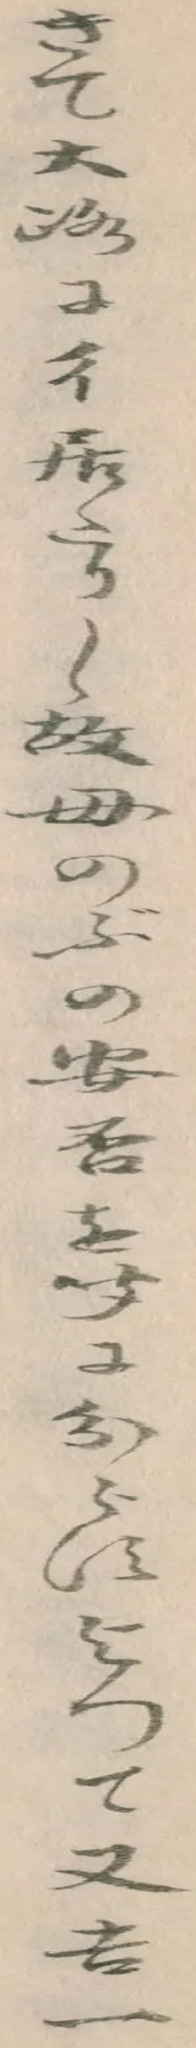きて大路に彳居たりし故母のぶの安否を聞に分らすよつて又吉一
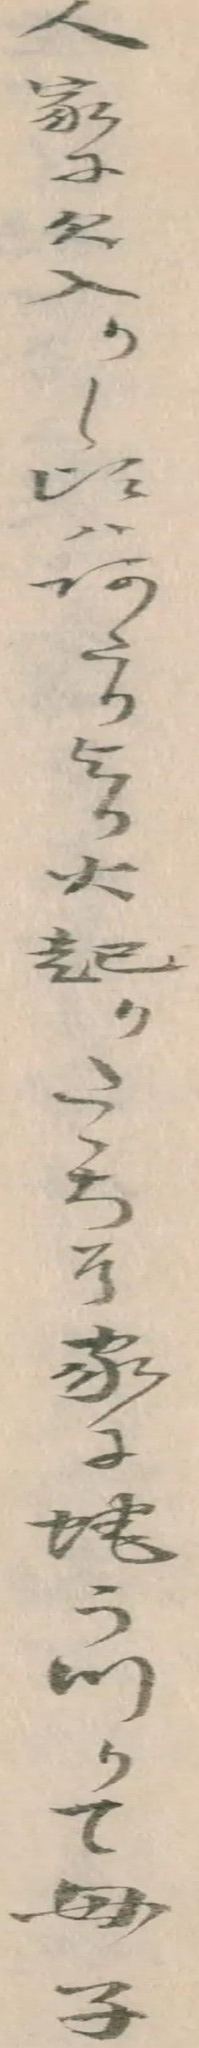人家に欠入りし頃はあたりより火起りたゝちに家に焼うつりて母子
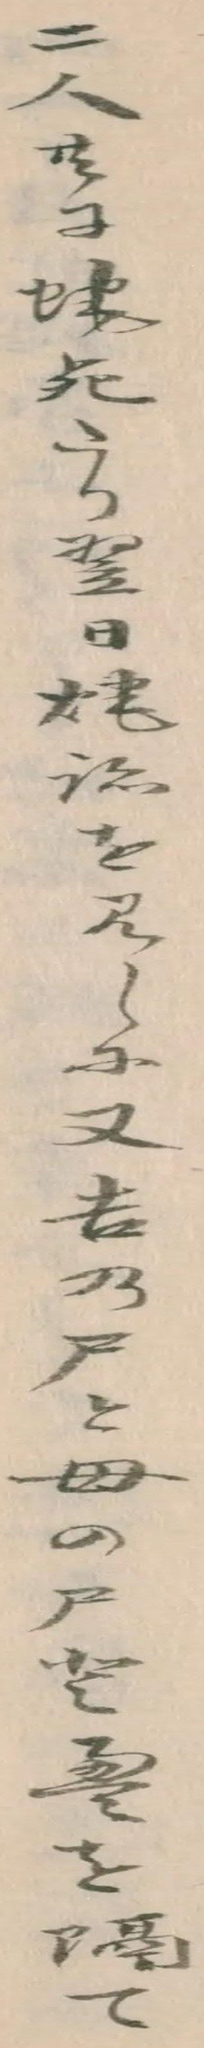二人共に焼死たり翌日焼跡を見しに又吉の屍と母の屍と畳を隔て
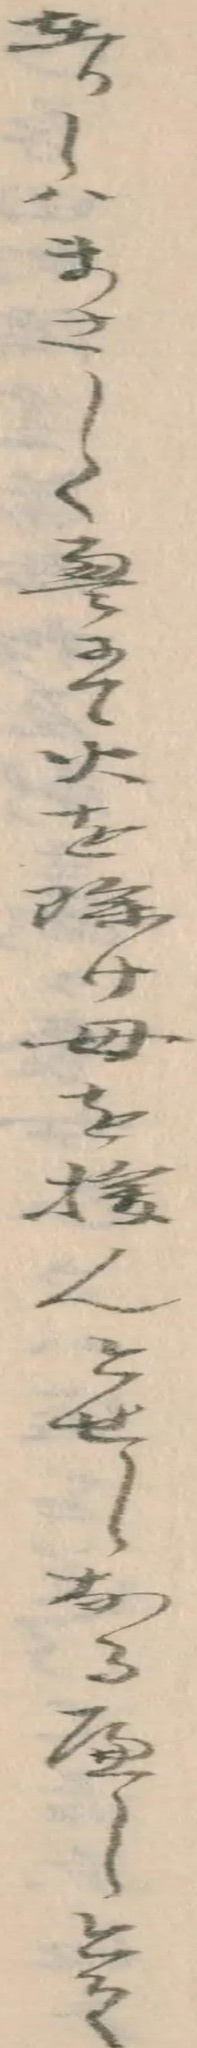在りしはまさしく畳にて火を除け母を援んとせしなるへしとて
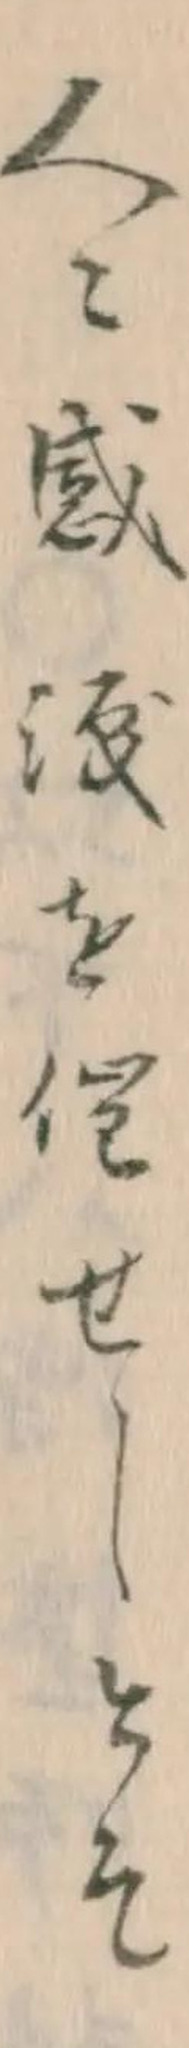人々感涙を催せしとそ
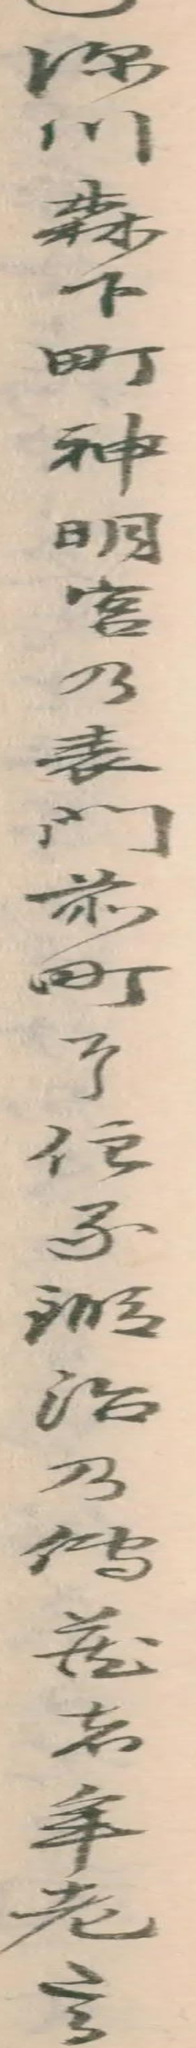〇深川森下町神明宮の表門前町に住る鍛冶の伝蔵は年老たる
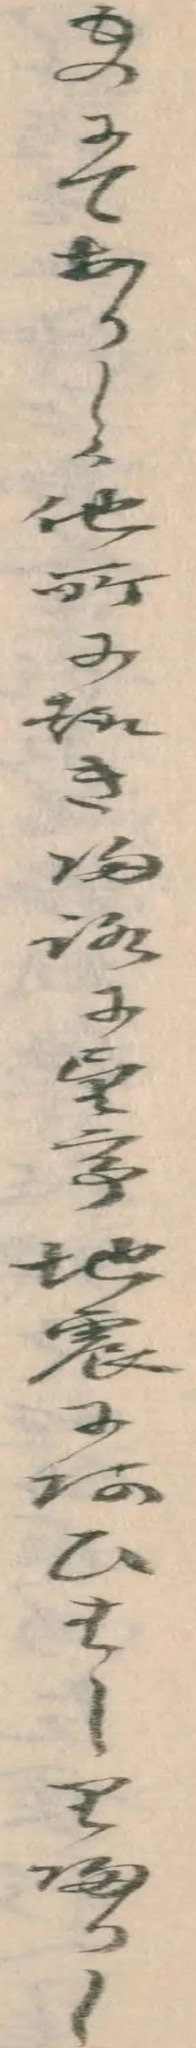ものにてありしか他所に趣き帰路に望て地震にあひはしり帰りし
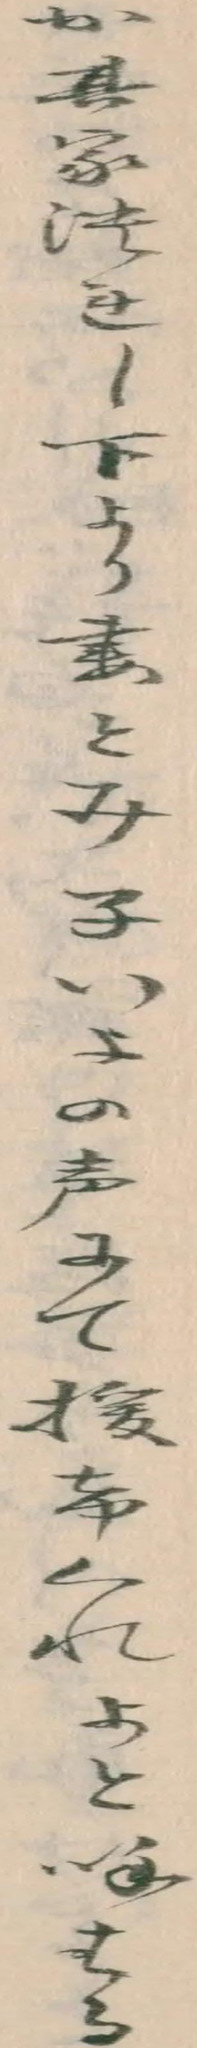か其家潰れし下より妻とみ子いよの声にて援けくれよと呼はる
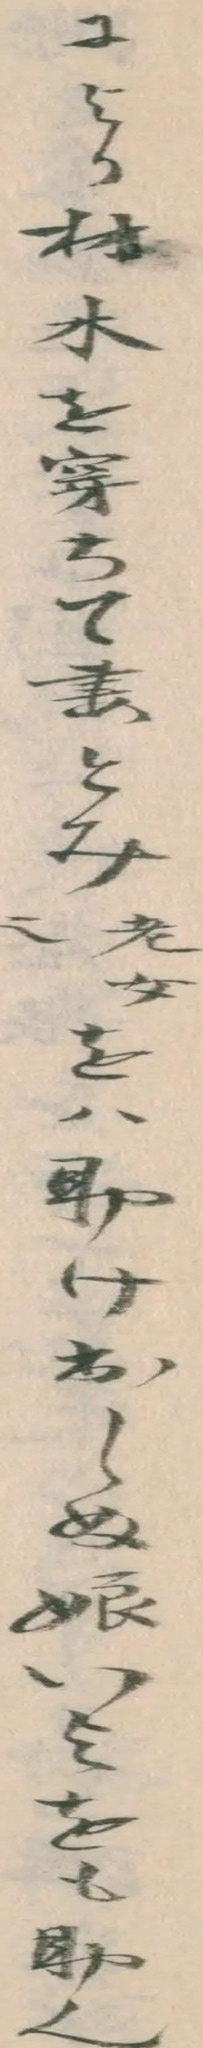により材木を穿ちて妻とみ老女也をは助け出しぬ娘いよをも助ん
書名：地災撮要. 巻10(地震之部) 上,下
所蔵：国立国会図書館 National Diet Library, JAPAN
